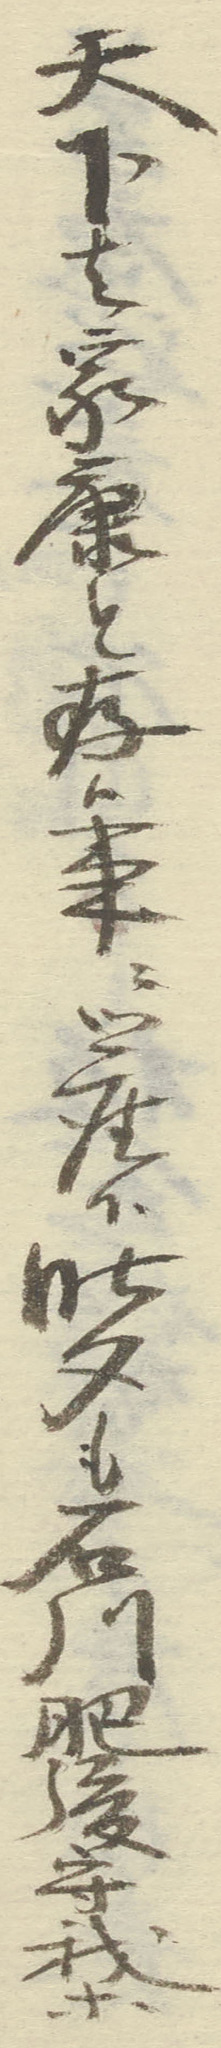天下は家康と存候事ニ御座候昨夕も石川肥後守我等
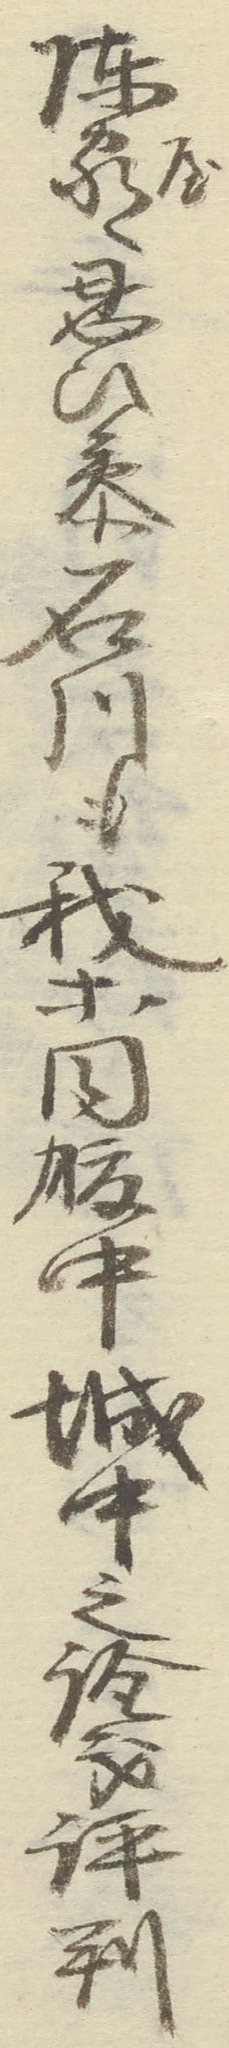陣家へ忍ひ参石川も我等同腹中城中之詮義評判
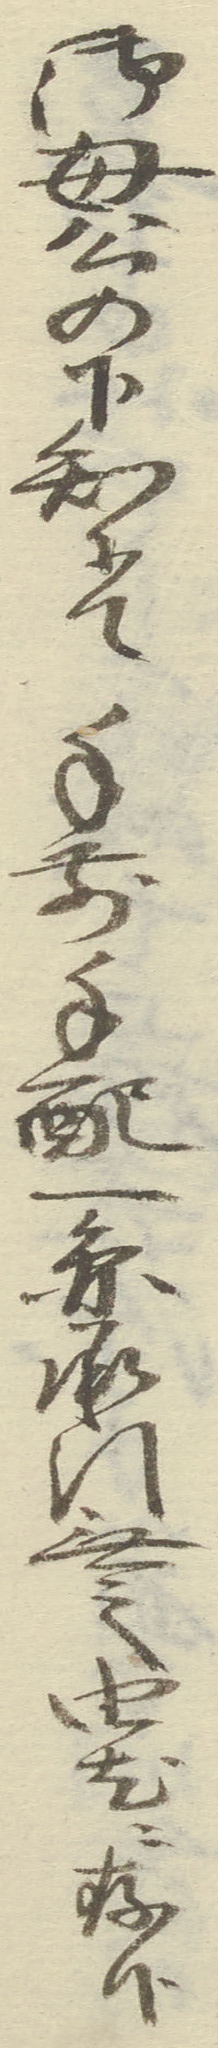御母公の下知にて手前手配一圓承引無之由尤ニ存候
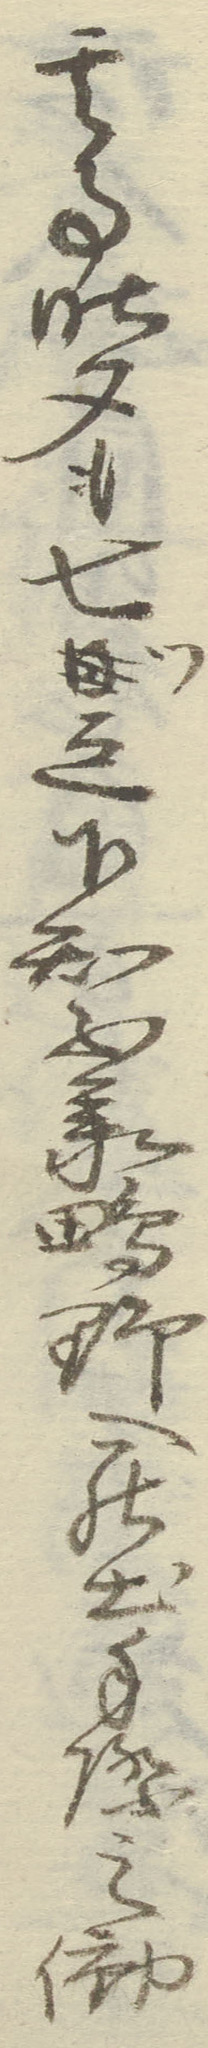其事昨夕も七ツ迄下知不承鴫野へ罷出手際之働

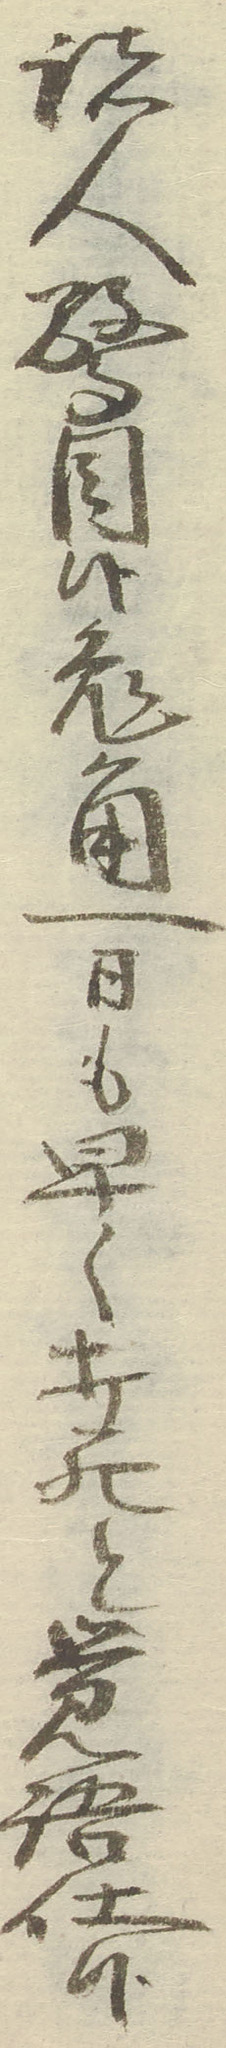諸人驚目候兎角一日も早く打死と覚悟仕候
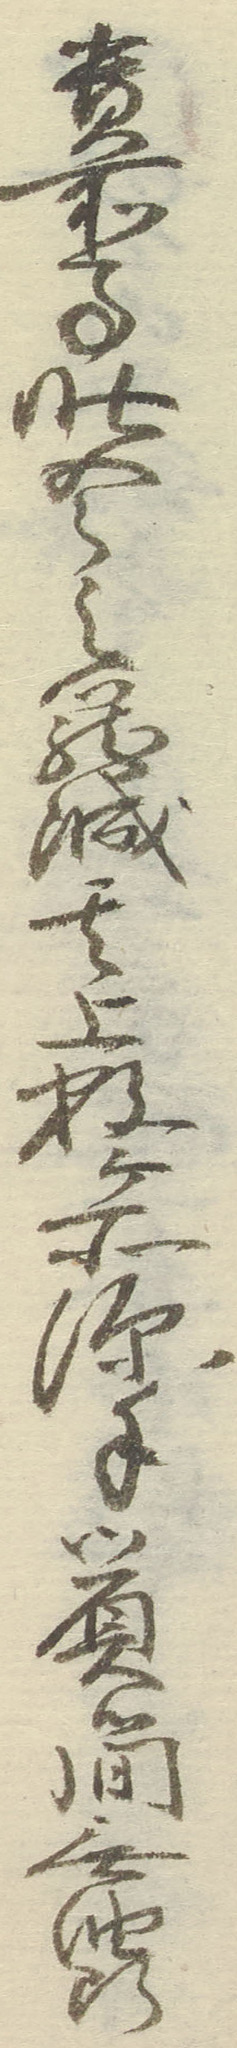貴所事昨今之籠城其上数ヶ所深手ヲ負候間無油断
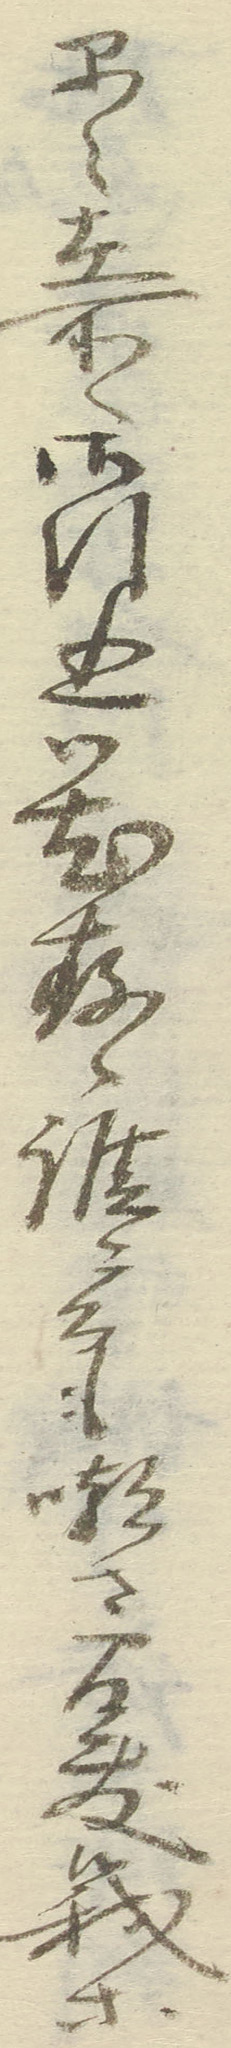早々在所へ御引込御尤存候誰ニ而も嘲有間敷候我等
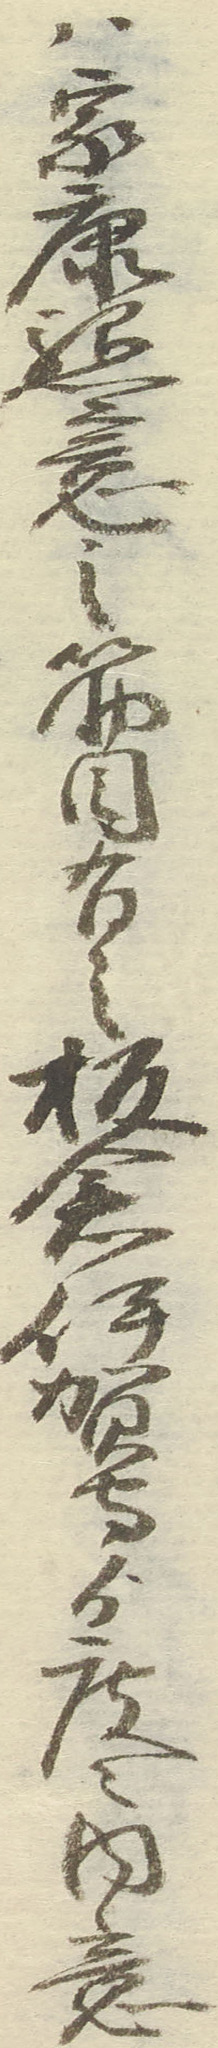ハ家康懇意之筋目有之板倉伊賀守ゟ度々内意
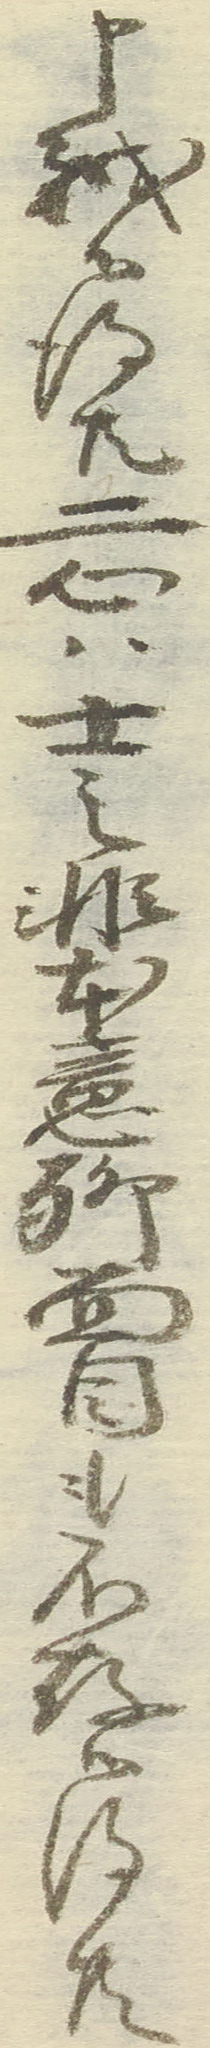申越候得共二心ハ士之非本意聊面目も不存候得共
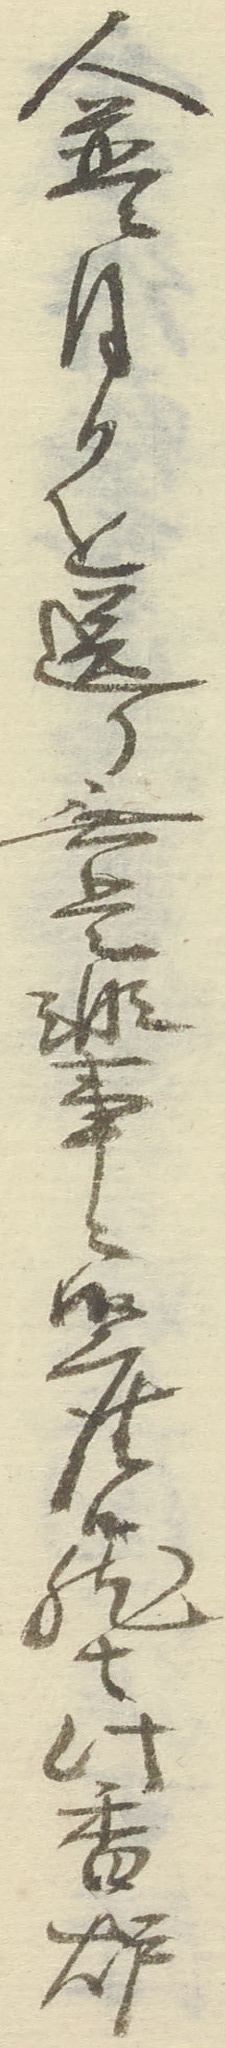人並ニ月日を送り無是非事ニ御座候然は此香炉
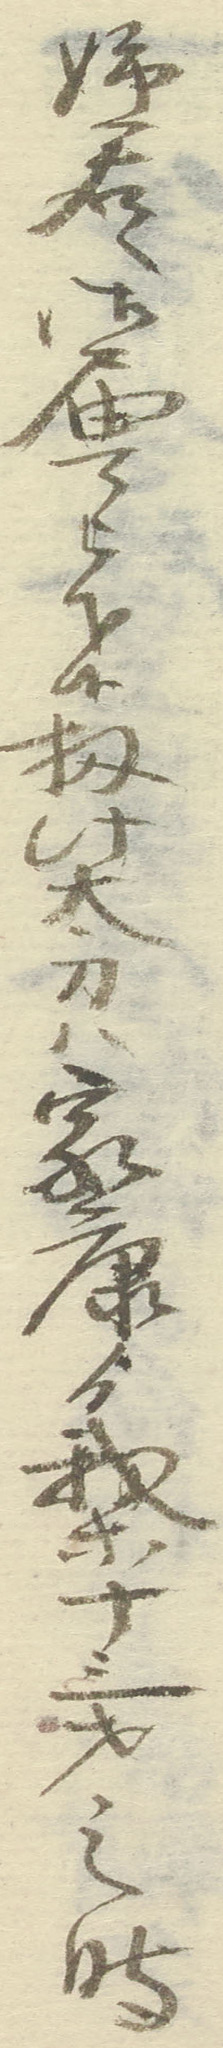姉君へ御届可被下候扨此太刀ハ家康ゟ我等十三才之時
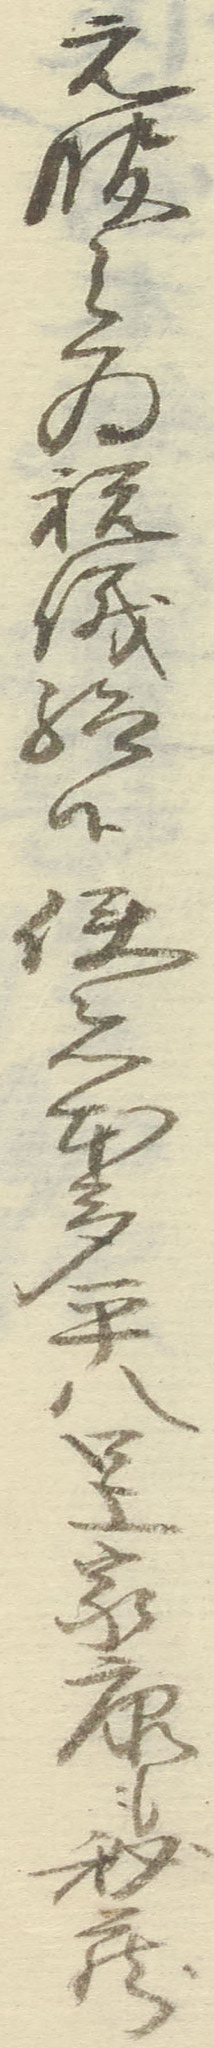元服之為祝儀給候使者本多平八口上家康も秘蔵
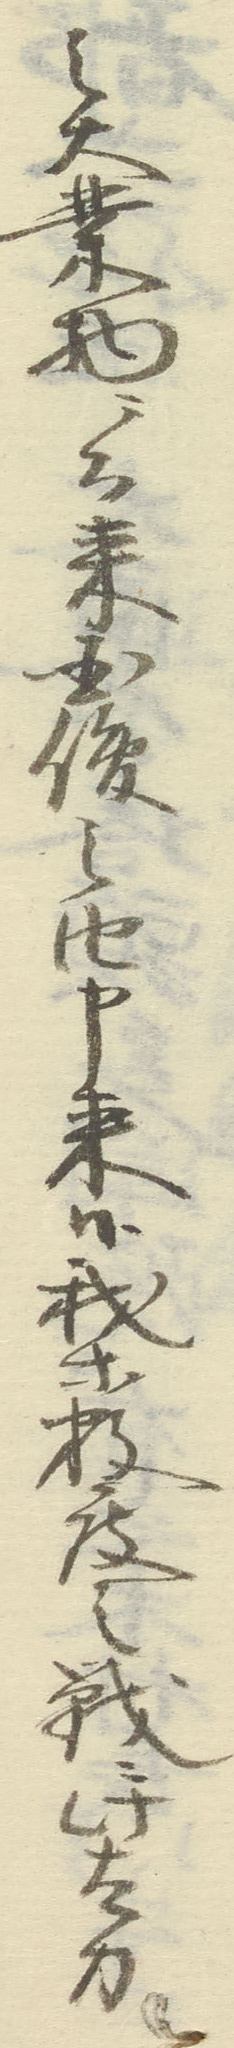之大業物ニ而来国俊之由申来候我等数度之戦ニ此太刀
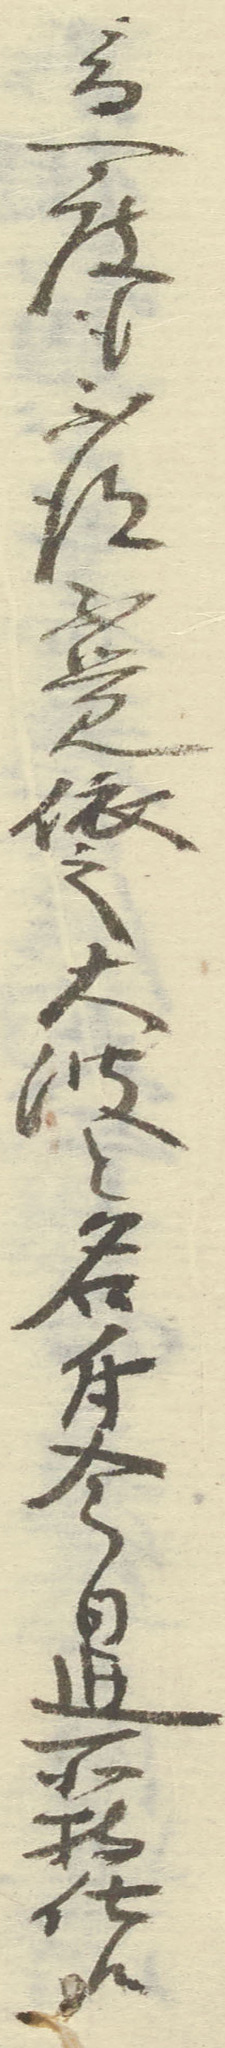ニ而一度も不得不覚依之大波と名付今日迄所持仕候
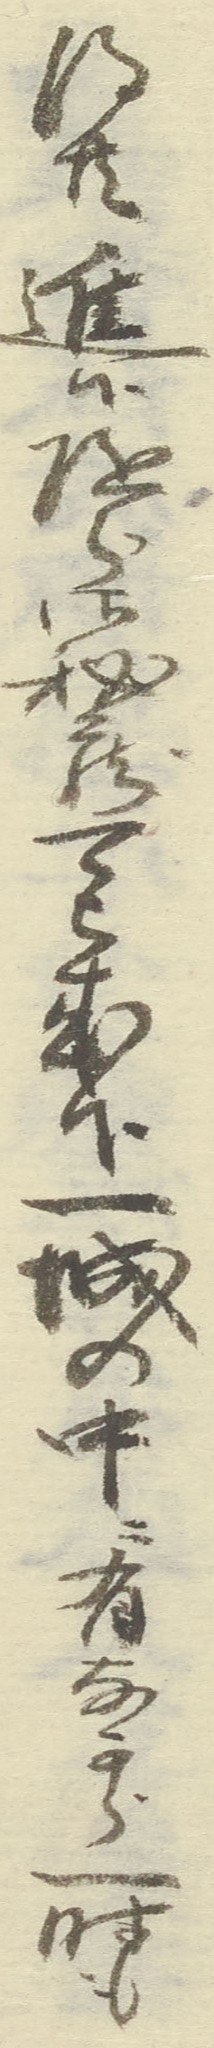得共進候随分御秘蔵可被成下一城の中ニ有なから一時も
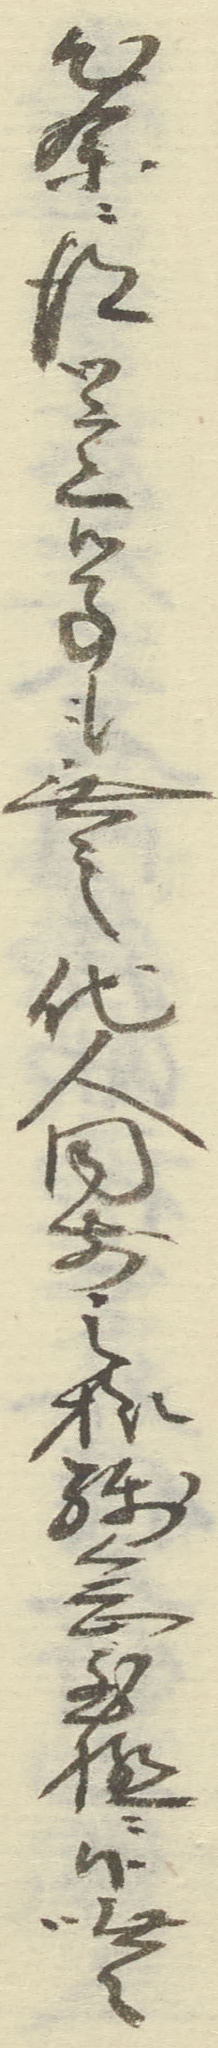心閑ニ得御意候事も無之他人同然之様残念至極ニ候嘸々
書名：[七月二日京都大地震に付御番衆大木市左衛門より申し越し候書面畧書状写]
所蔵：東京大学総合図書館 General Library in the University of Tokyo, JAPAN
